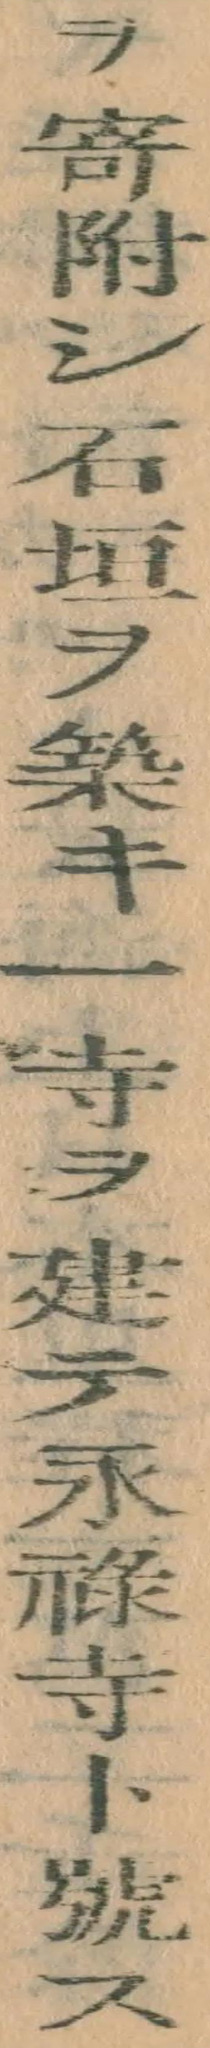ヲ寄附シ石垣ヲ築キ一寺ヲ建テ永禄寺ト号ス
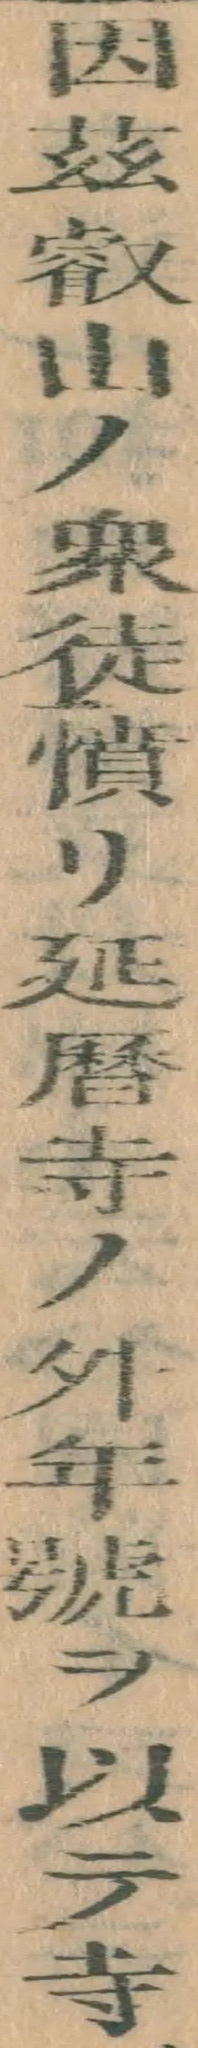因茲叡山ノ衆徒憤リ延暦寺ノ外年号ヲ以テ寺
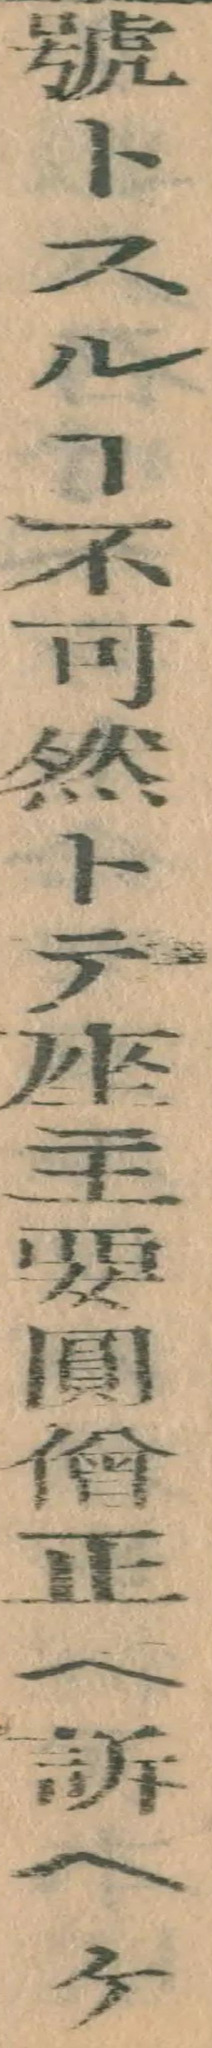号トスルヿ不可然トテ座主要円僧正ヘ訴ヘケ
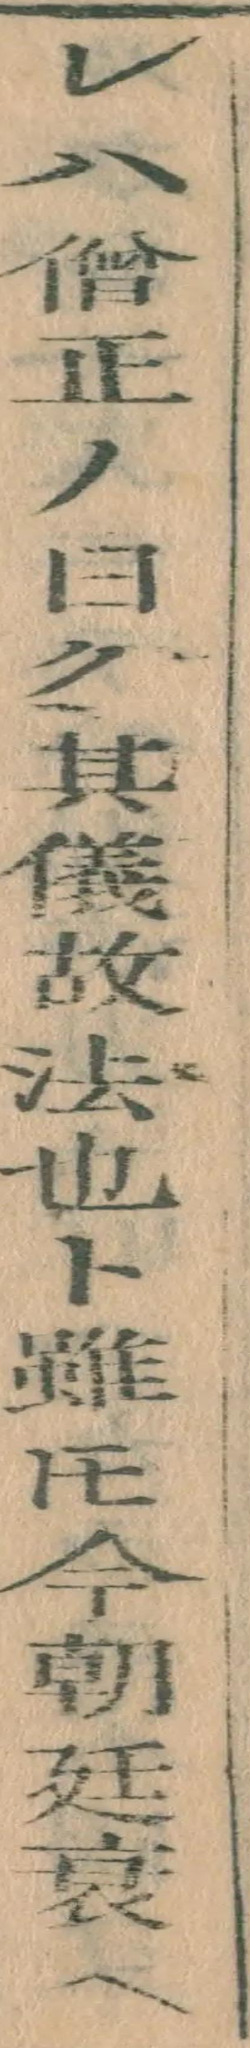レハ僧正ノ曰ク其儀故法也ト雖トモ今朝廷衰ヘ
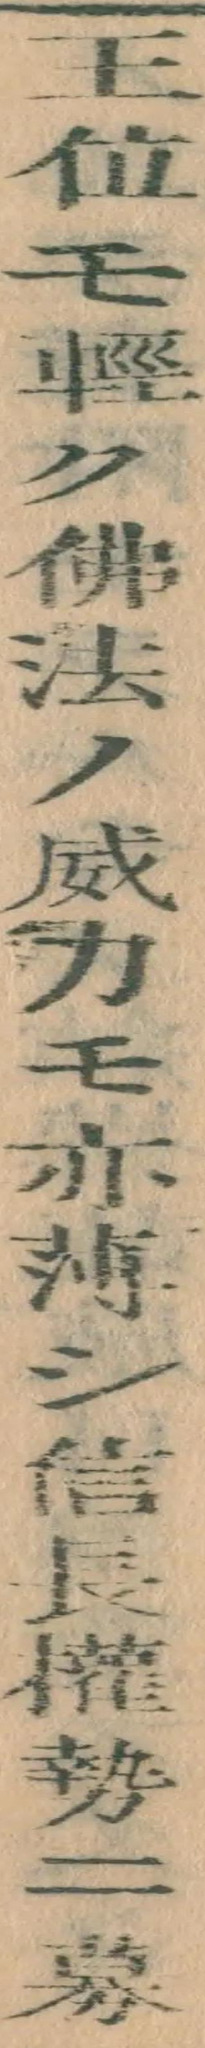王位モ軽ク仏法ノ威力モ亦薄シ信長権勢ニ募
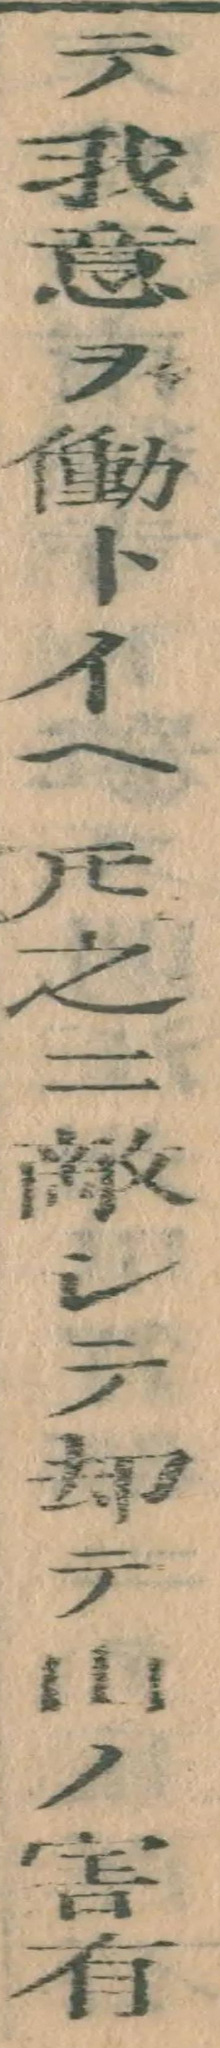テ我意ヲ働トイヘトモ之ニ敵シテ却テ山ノ害有
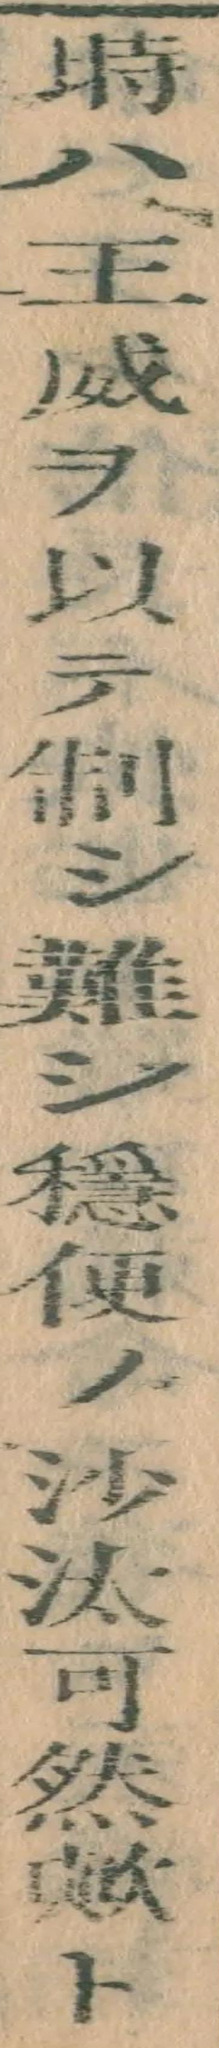時ハ王威ヲ以テ制シ難シ穏便ノ沙汰可然歟ト
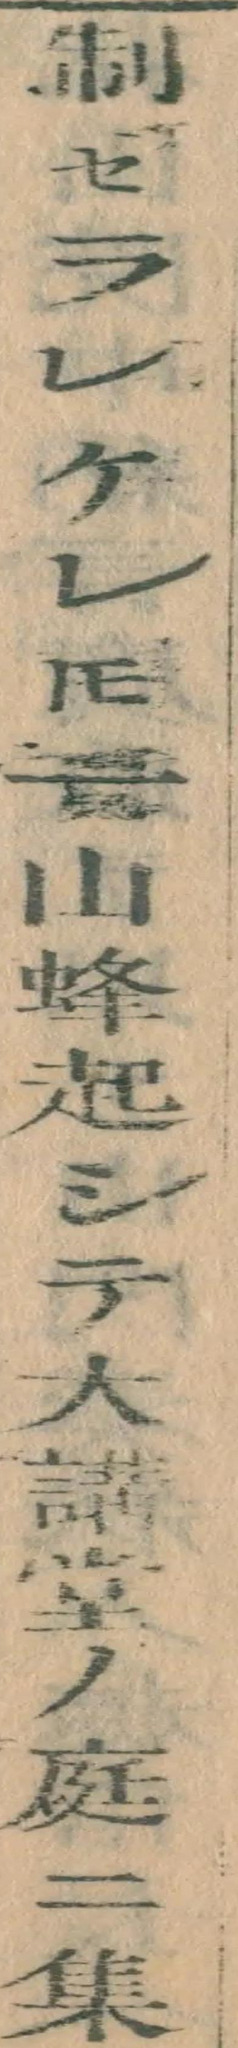制セラレケレトモ一山蜂起シテ大講堂ノ庭ニ集
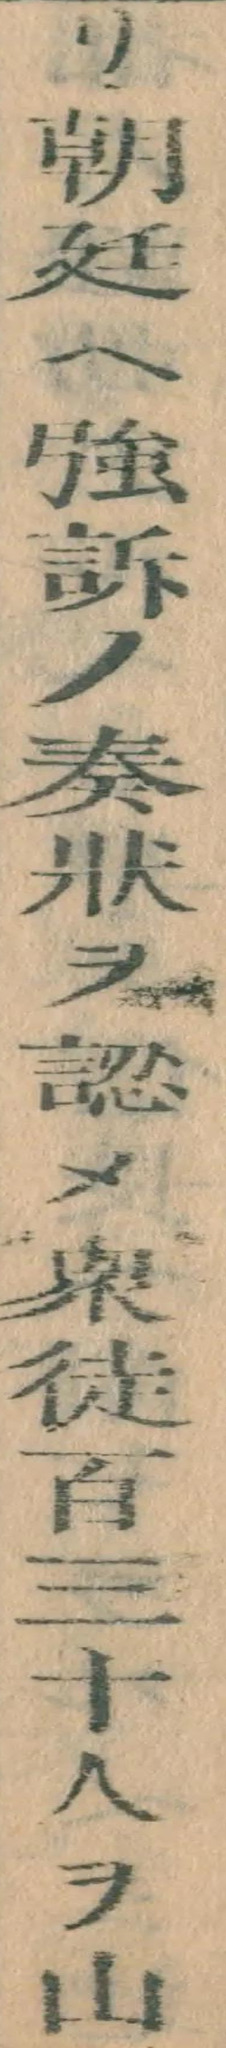リ朝廷ヘ強訴ノ奏状ヲ認メ衆徒百三十人ヲ山
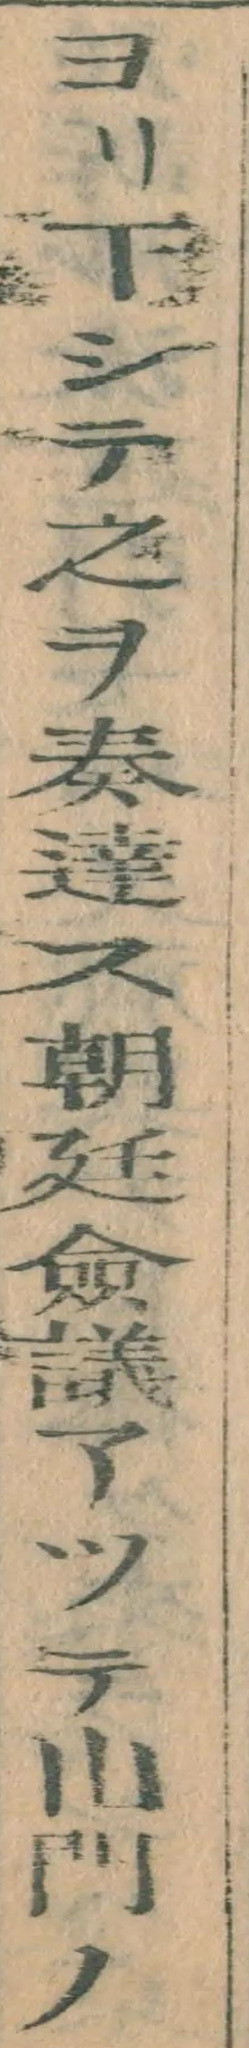ヨリ下シテ之ヲ奏達ス朝廷僉議アツテ山門ノ

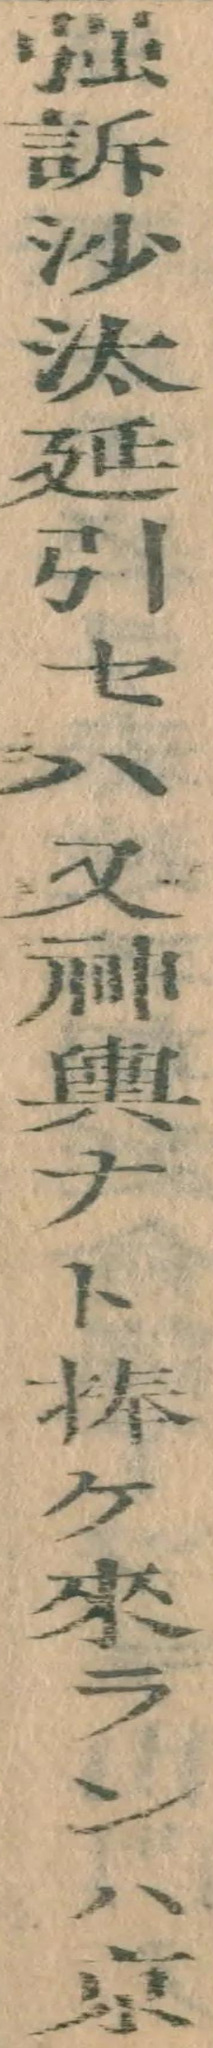強訴沙汰延引セハ又神輿ナト捧ケ来ランハ京
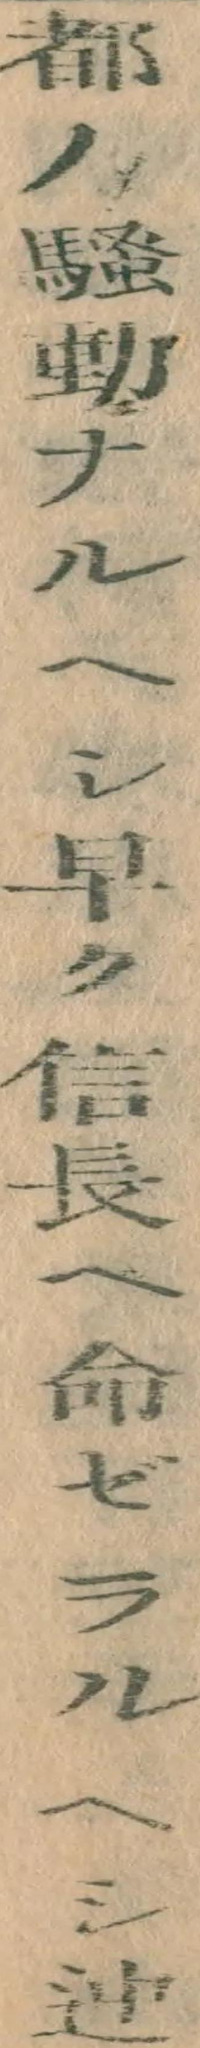都ノ騒動ナルヘシ早ク信長ヘ命ゼラルヘシ迚
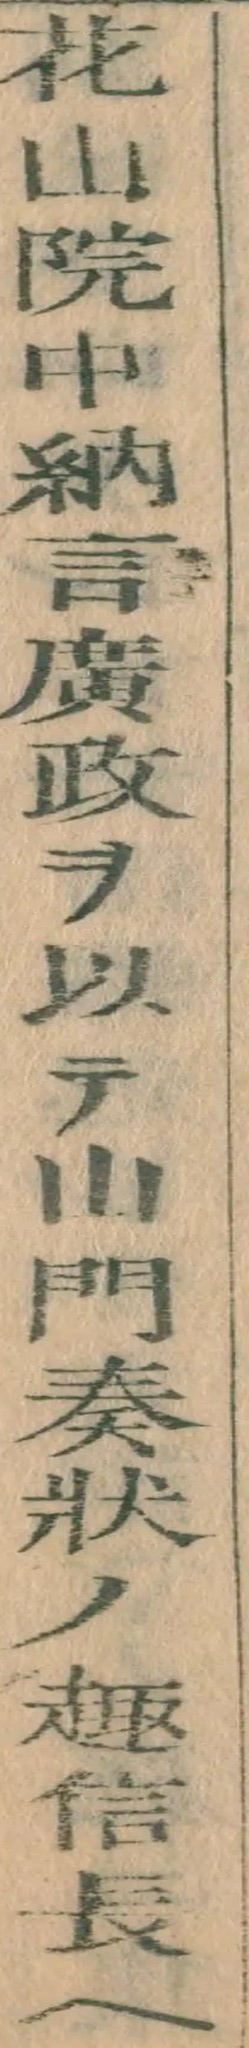花山院中納言広政ヲ以テ山門奏状ノ趣信長ヘ
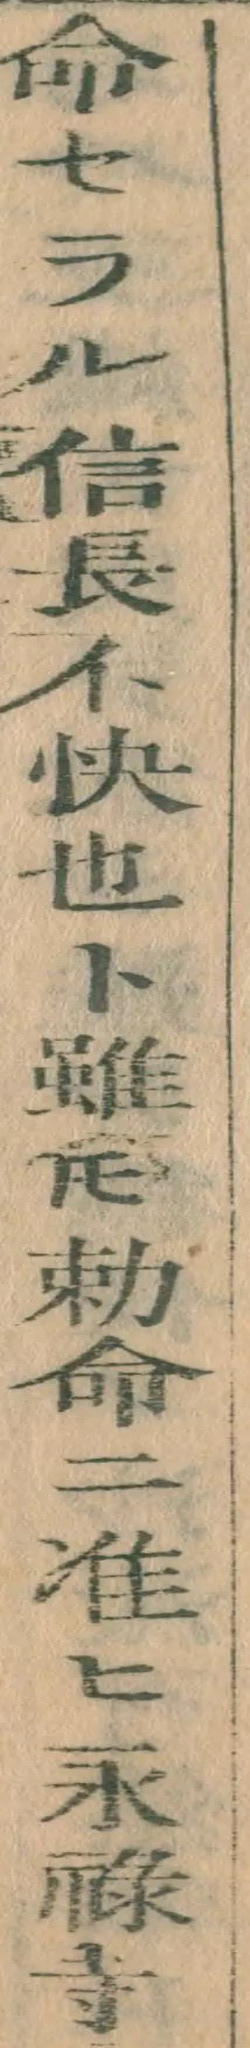命セラル信長不快也ト雖トモ勅命ニ准ヒ永禄寺
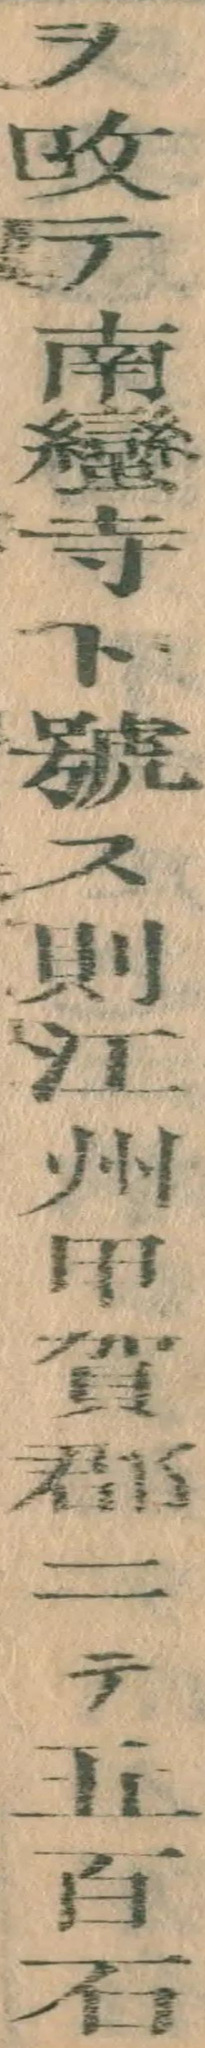ヲ改テ南蛮寺ト号ス則江州甲賀郡ニテ五百石
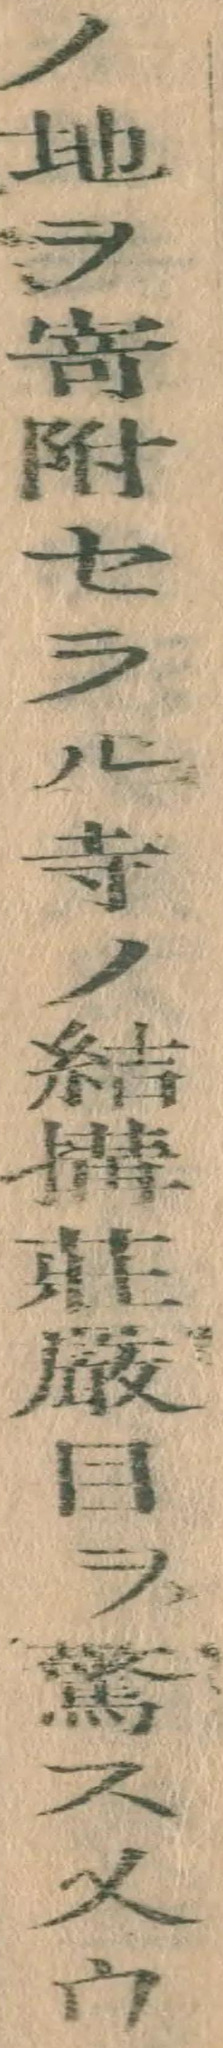ノ地ヲ寄附セラル寺ノ結搆荘厳目ヲ驚ス又ウ
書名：南蛮寺興廃記
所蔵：国立国会図書館 National Diet Library, JAPAN
